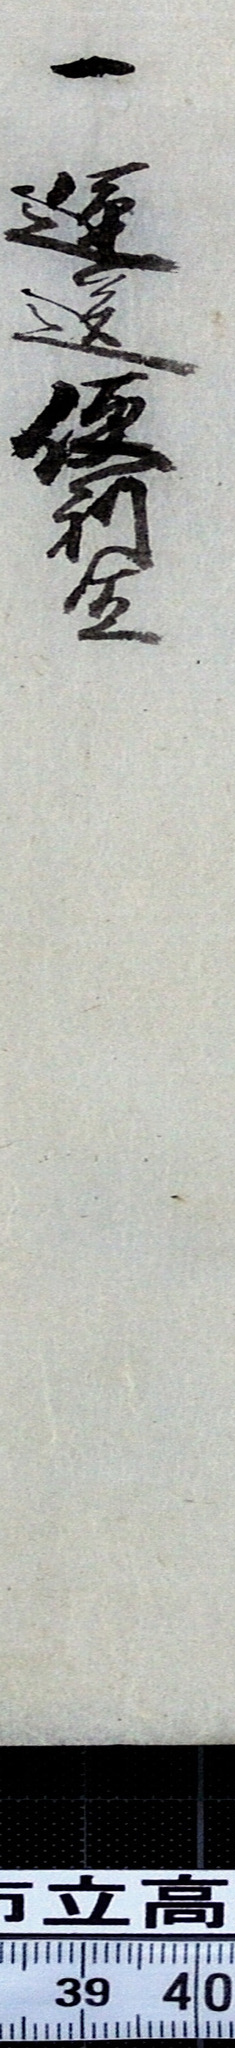一運送便利宜
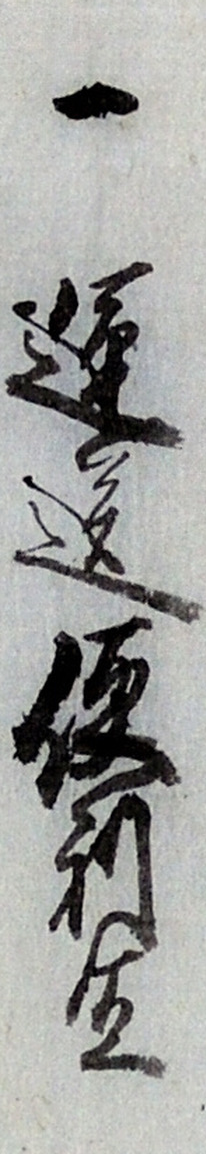一運送便利宜

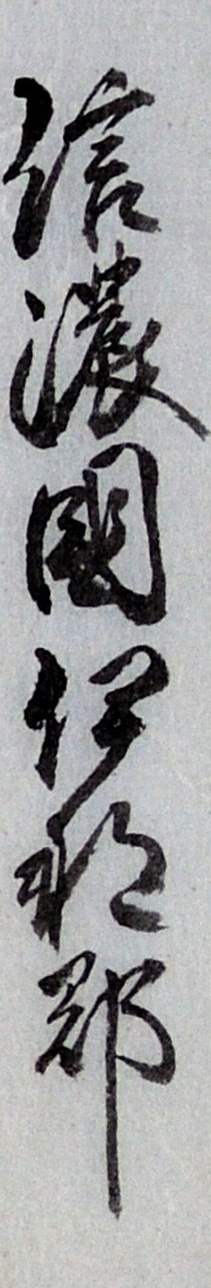信濃国伊那郡
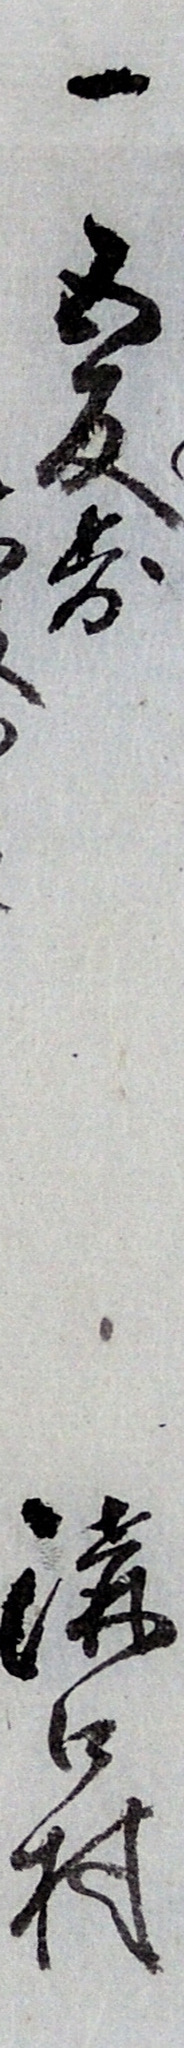一五反歩溝口村
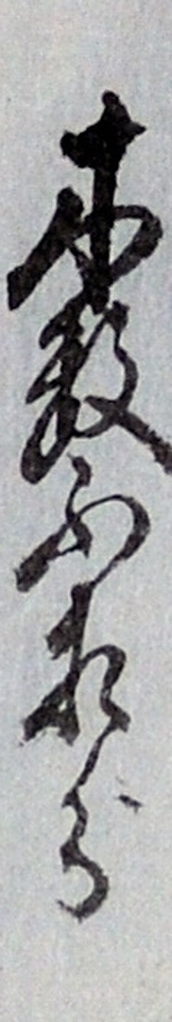木数不相分
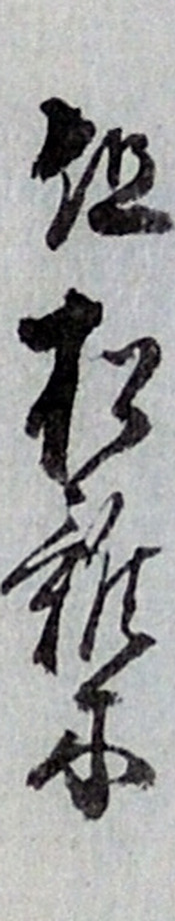但松雑木
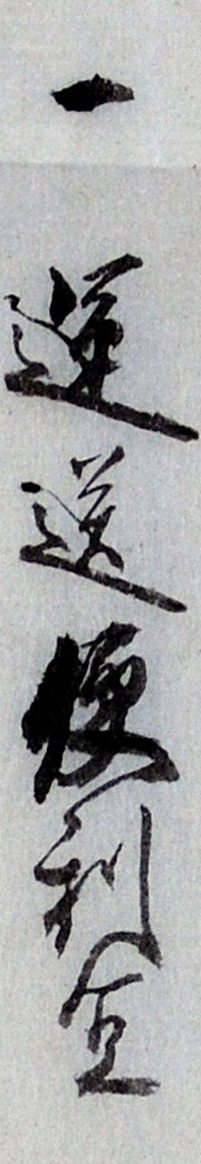一運送便利宜
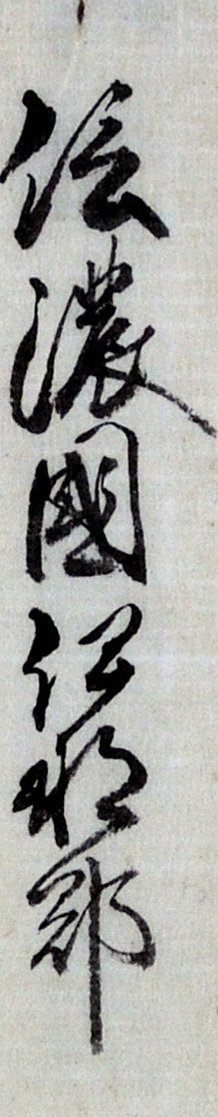信濃国伊那郡
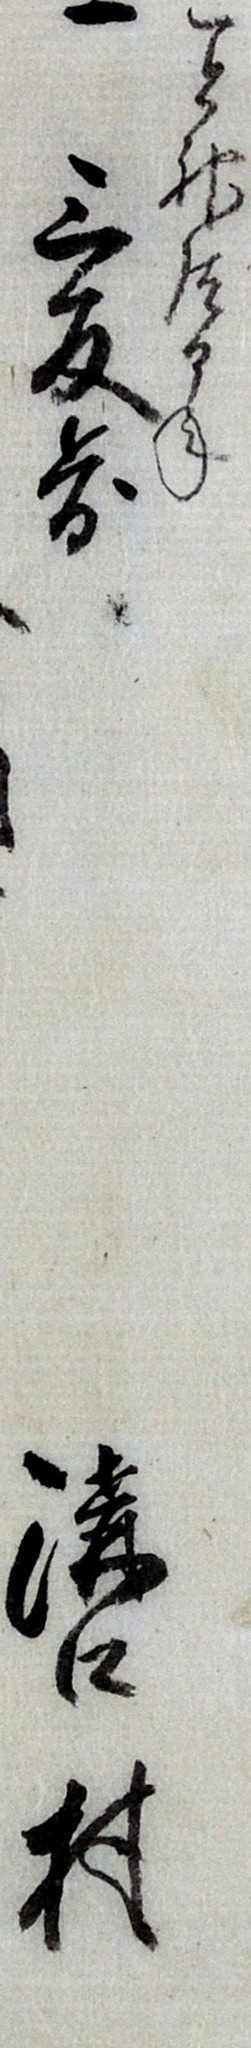一三反歩溝口村
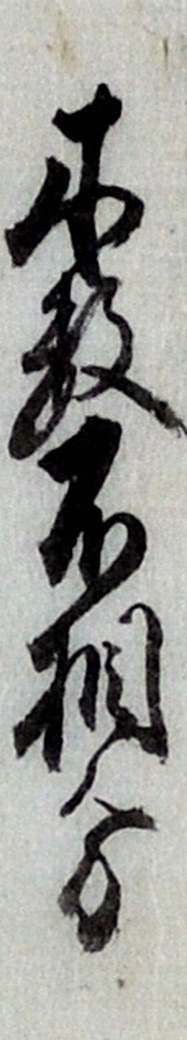木数不相分
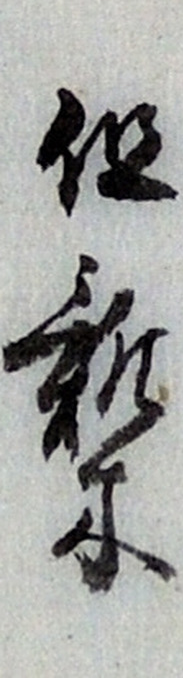但雑木
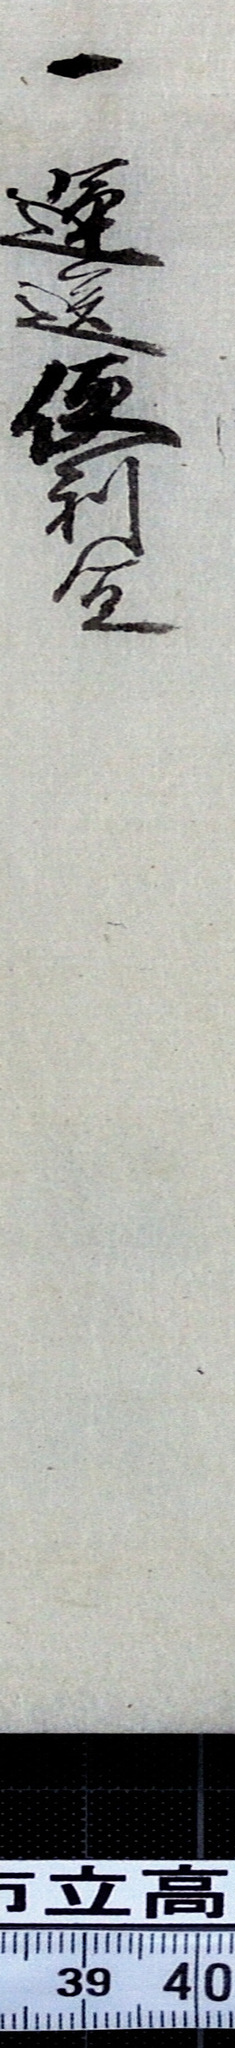一運送便利宜
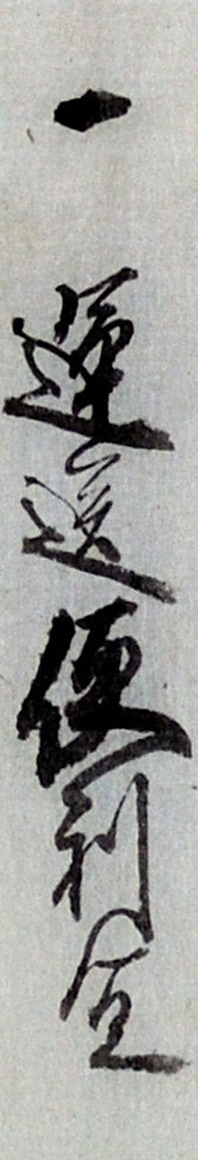一運送便利宜
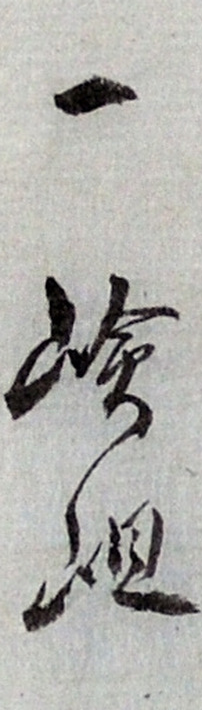一嶮岨

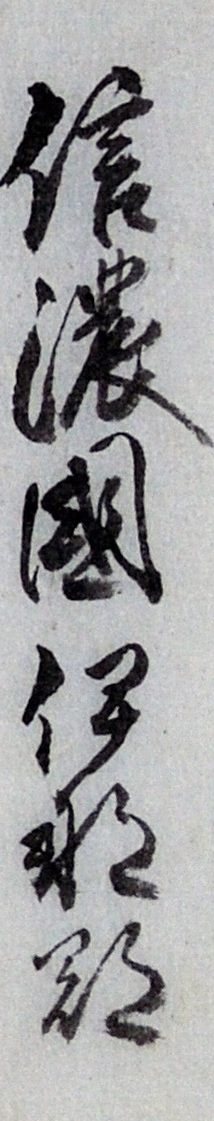信濃国伊那郡
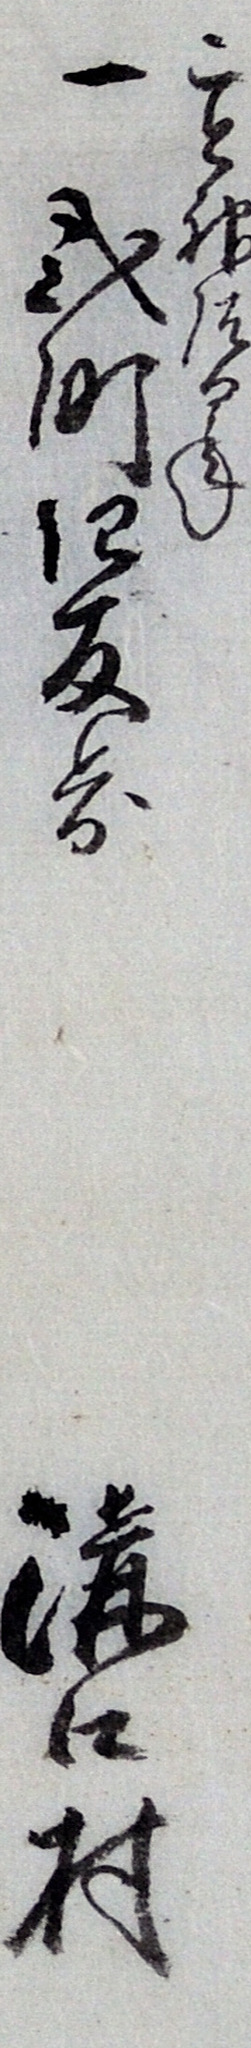一弐町四反歩溝口村
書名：官林反別帳
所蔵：伊那市立高遠町図書館・合同会社AMANE
